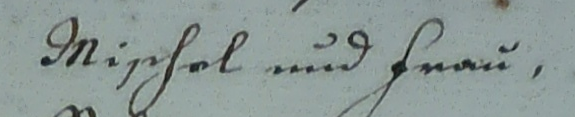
Mischel und Frau,
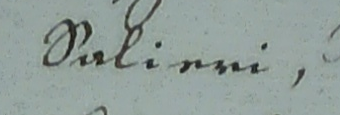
Salieri,
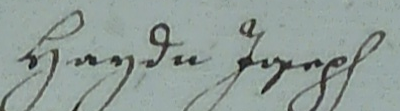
Haydn Joseph
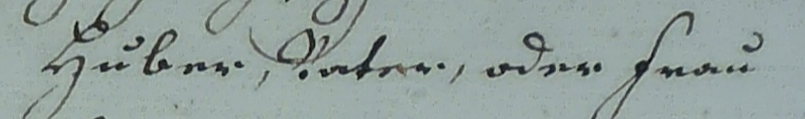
Huber, Vater, oder Frau
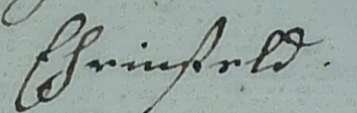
Ehrinfeld.
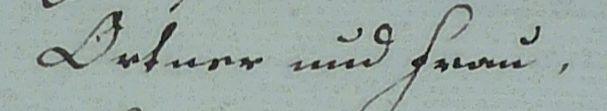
Ortner und Frau,
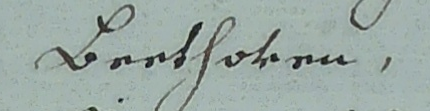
Beethoven,
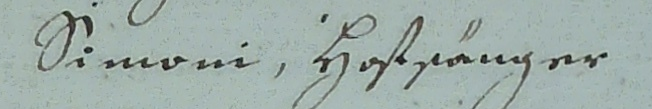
Simoni, Hofsänger
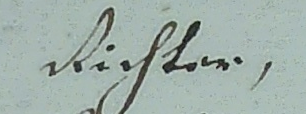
Richter,
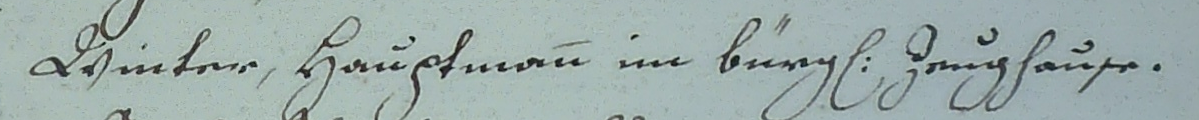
Winter, Hauptman̅ im bürgE: Zeughause.
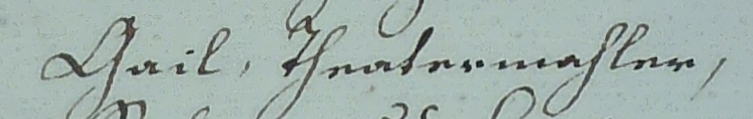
Gail, Theatermahler,
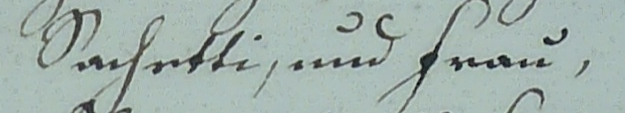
Sachetti, und Frau,
